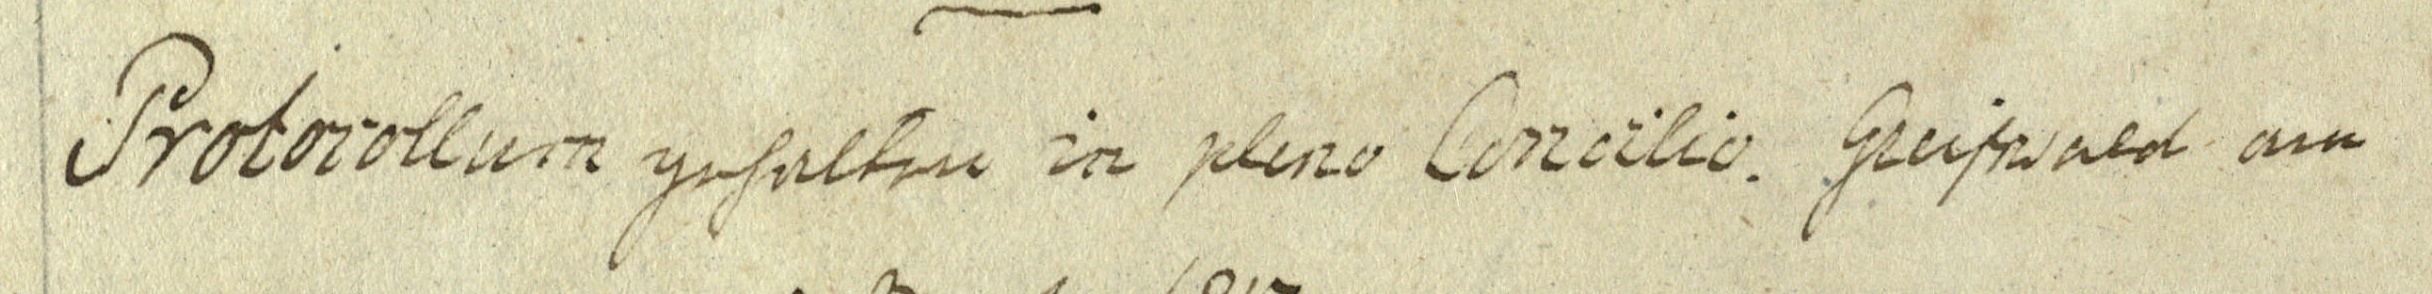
Protocollum gehalten in pleno Concilii. Greifswald am
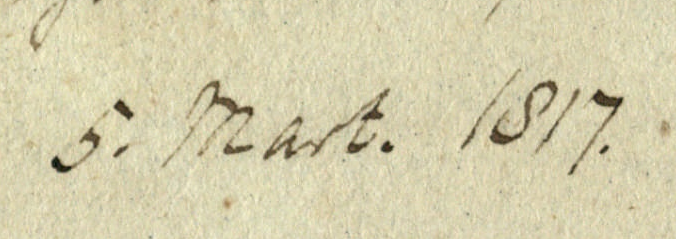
5. Mart. 1817.
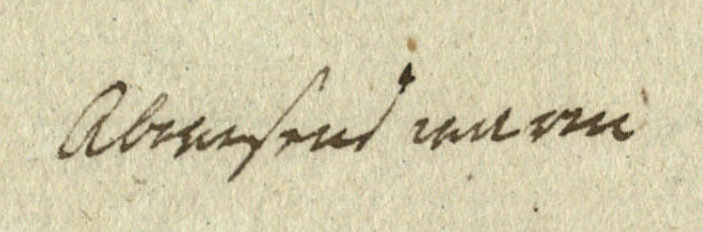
Abwesend waren
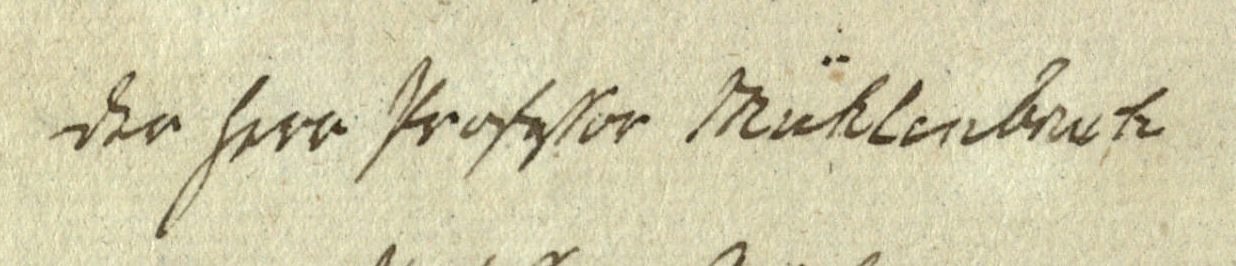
der Herr Professor Mühlenbruch.
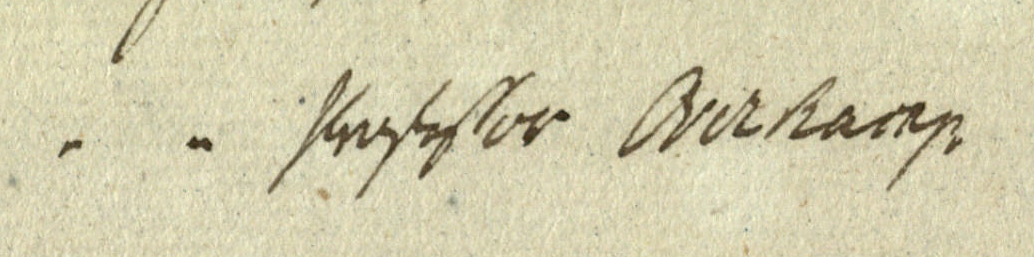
Professor Overkamp
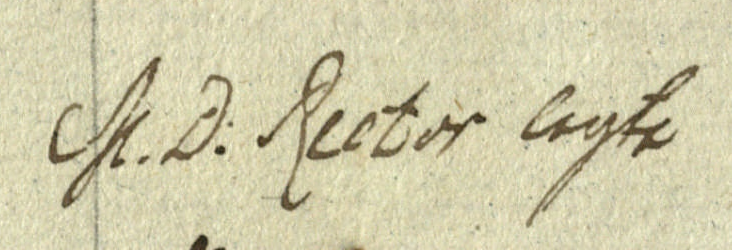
M. D. Rector legte
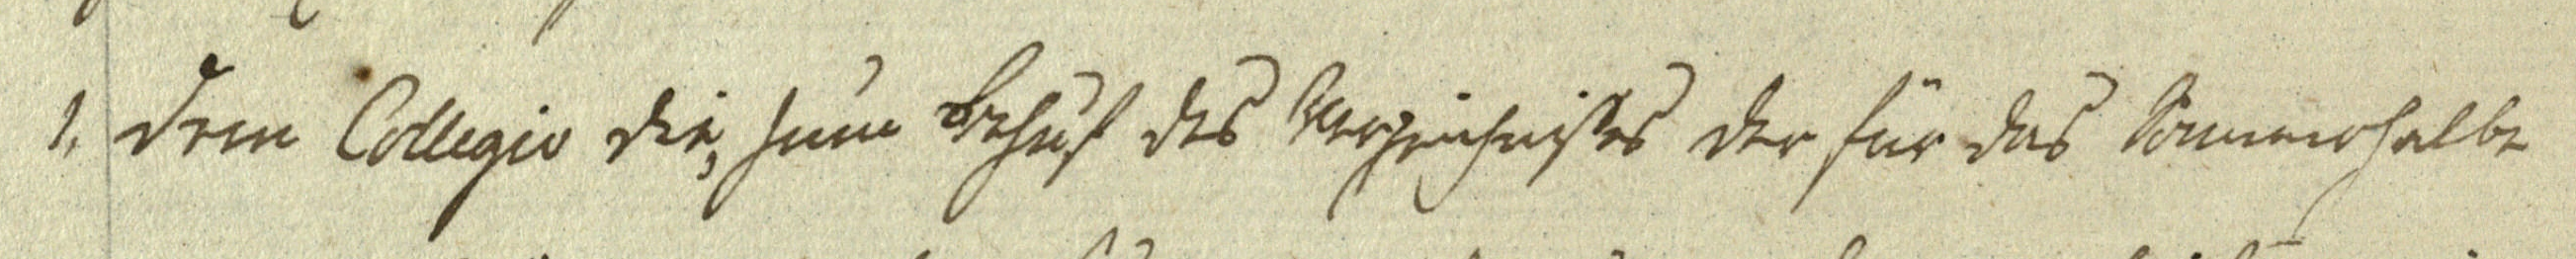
1. dem Collegio die, zum Behuf des Verzeichnisses der für das Sommerhalbe
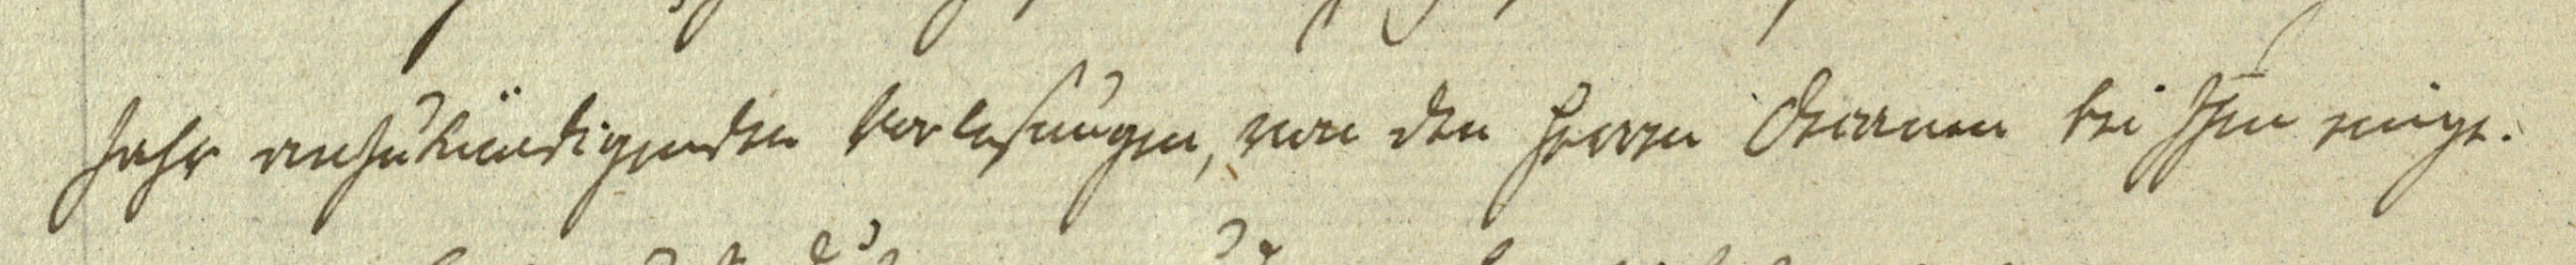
Jahr anzukündigenden Vorlesungen, von den Herren Decanen bei Ihm einge¬
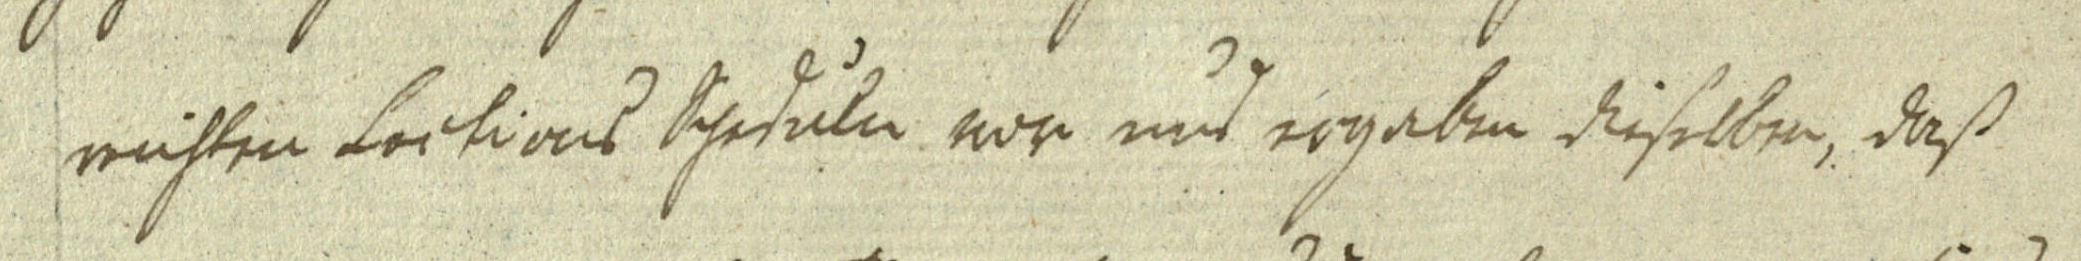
reichten Lections Scheduln vor und ergaben dieselben, daß
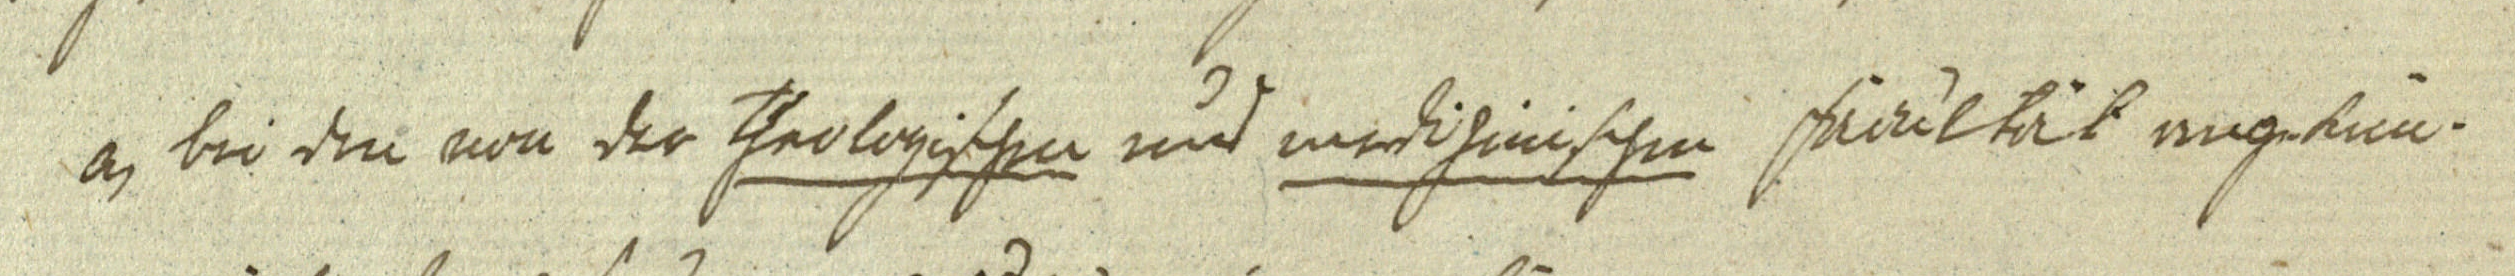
a, bei den von der Theologischen und medizinischem Facultät angekün¬
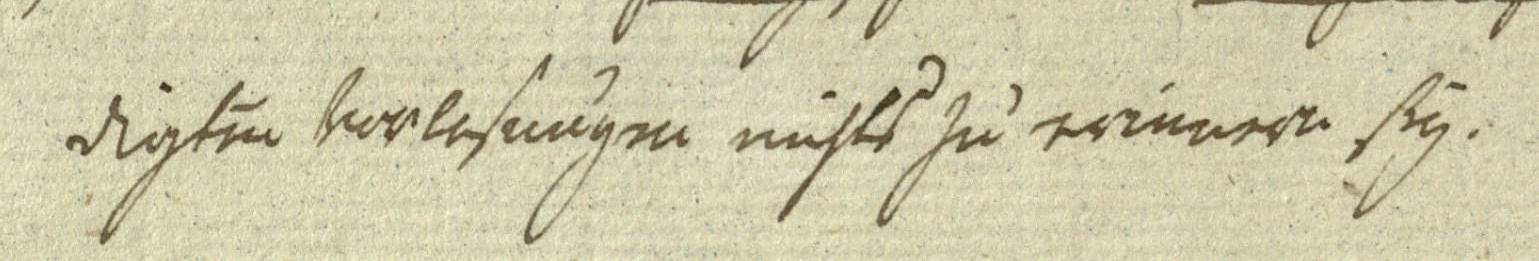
digten Vorlesungen nichts zu erinnern seÿ.
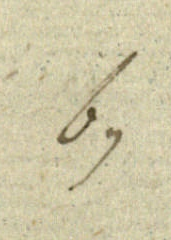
b.
